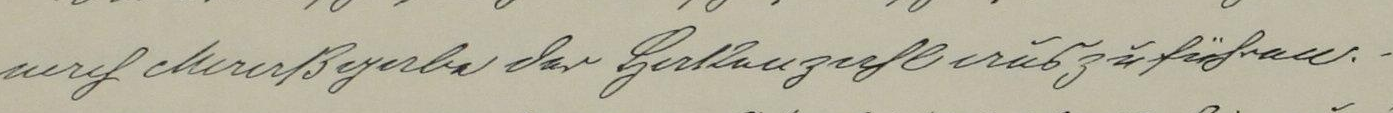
nach Maaßgabe der Hakenzahl auszuführen.
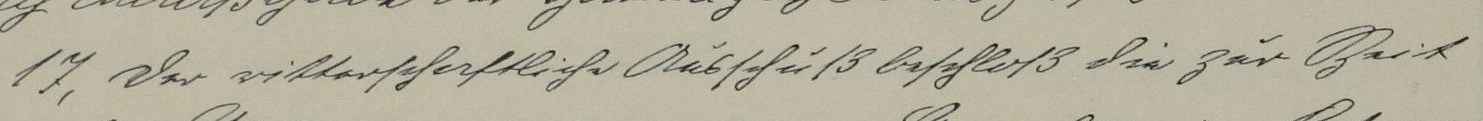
17. Der ritterschaftliche Ausschuß beschloß die zur Zeit
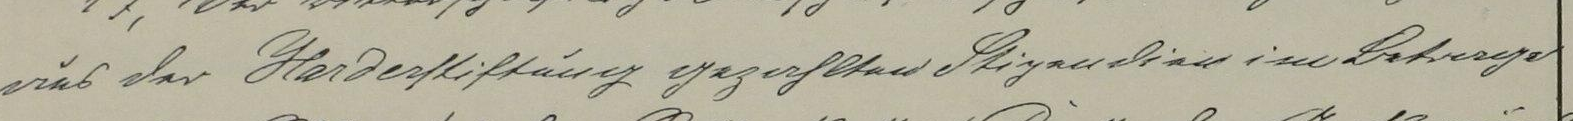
aus der Harderstiftung gezahlten Stipendien im Betrage
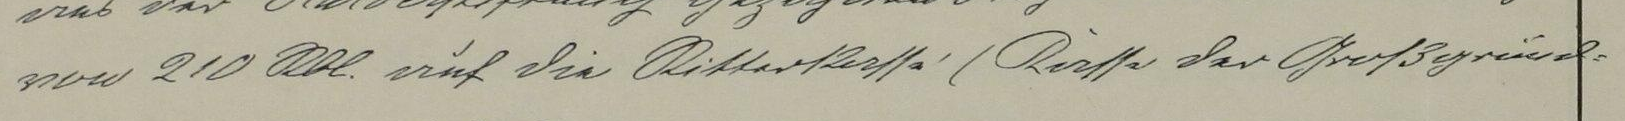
von 210 Rbl. auf die Ritterkasse (Kasse der Großgrund-
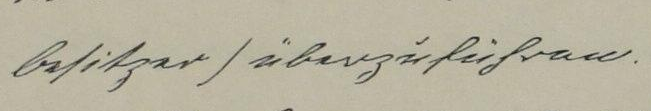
besitzer) überzuführen.
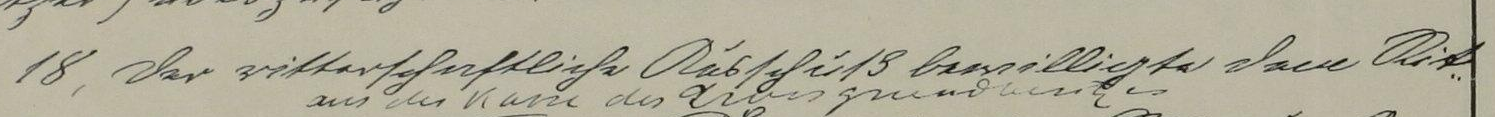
18. Der ritterschaftliche Ausschuß bewilligte dem Rit-
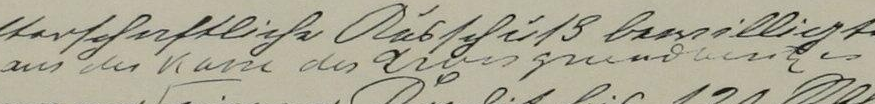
aus der Kasse der Großgrundbesitzer
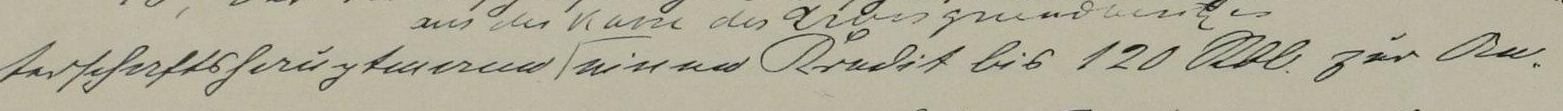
terschaftshauptmann einen Kredit bis 120 Rbl. zur An-
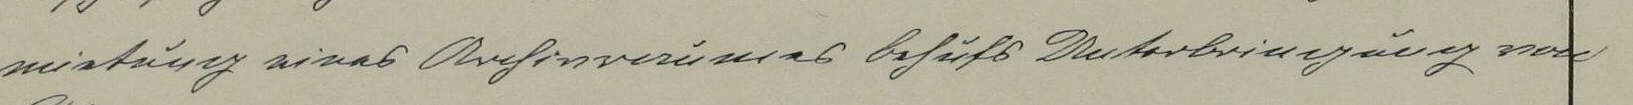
mietung eines Archivraumes behufs Unterbringung von
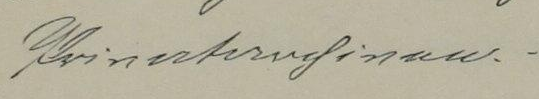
Privatarchiven.
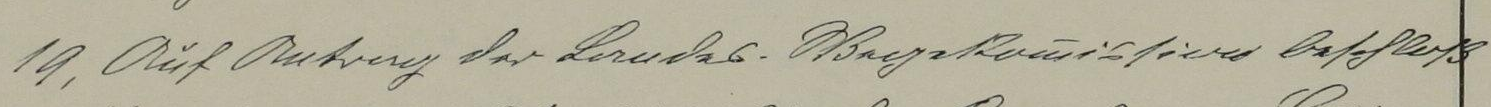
19. Auf Antrag der Landes-Wegekommission beschloß
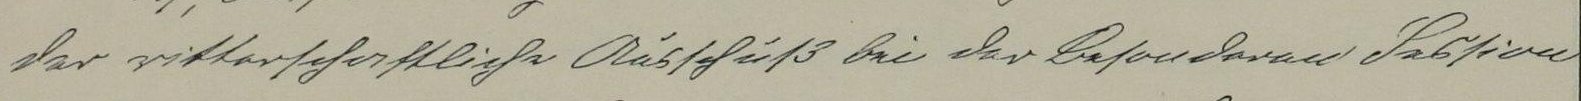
der ritterschaftliche Ausschuß bei der Besonderen Session
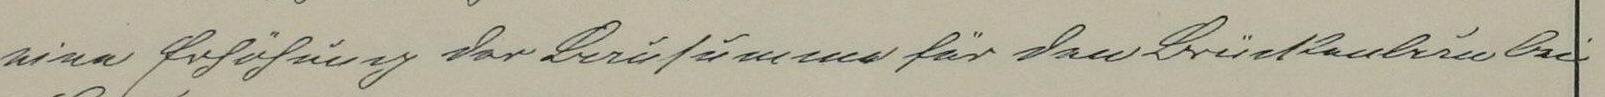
eine Erhöhung der Bausumme für den Brückenbau bei
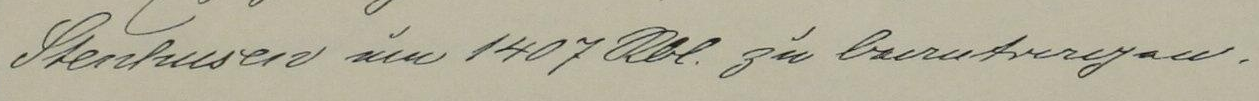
Stenhusen um 1407 Rbl. zu beantragen.
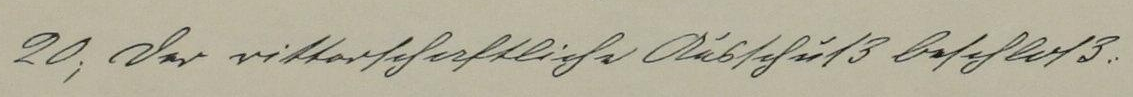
20. Der ritterschaftliche Ausschuß beschloß:
